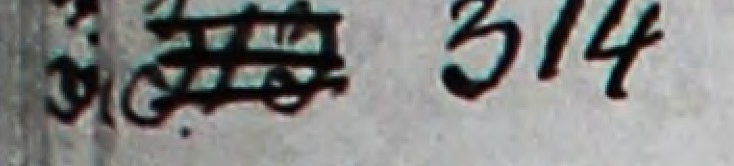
313 314
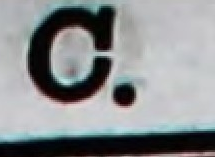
C.
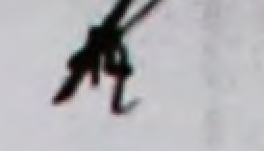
K
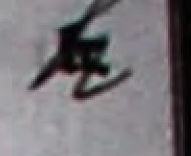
fr
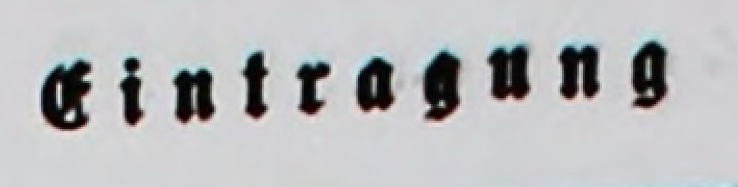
Eintragung
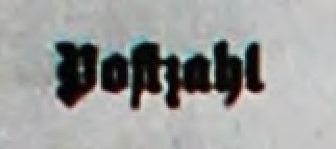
Postzahl
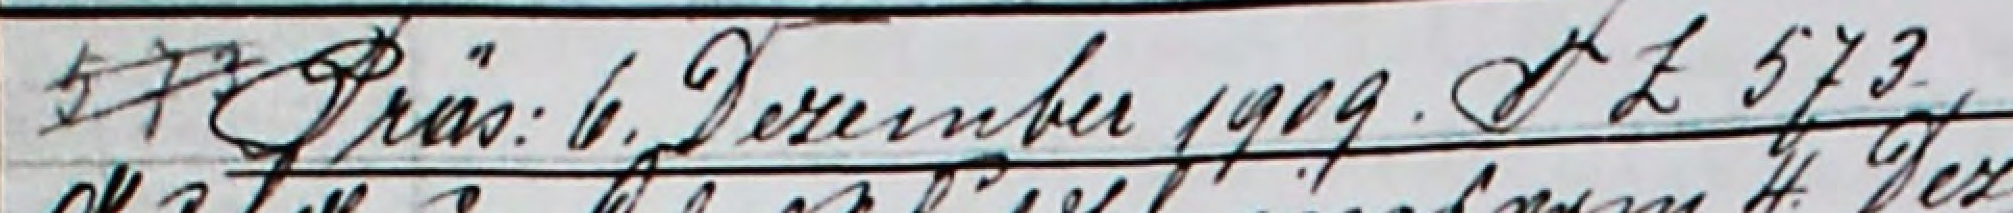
573 Präs: 6. Dezember 1909. T Z 573.
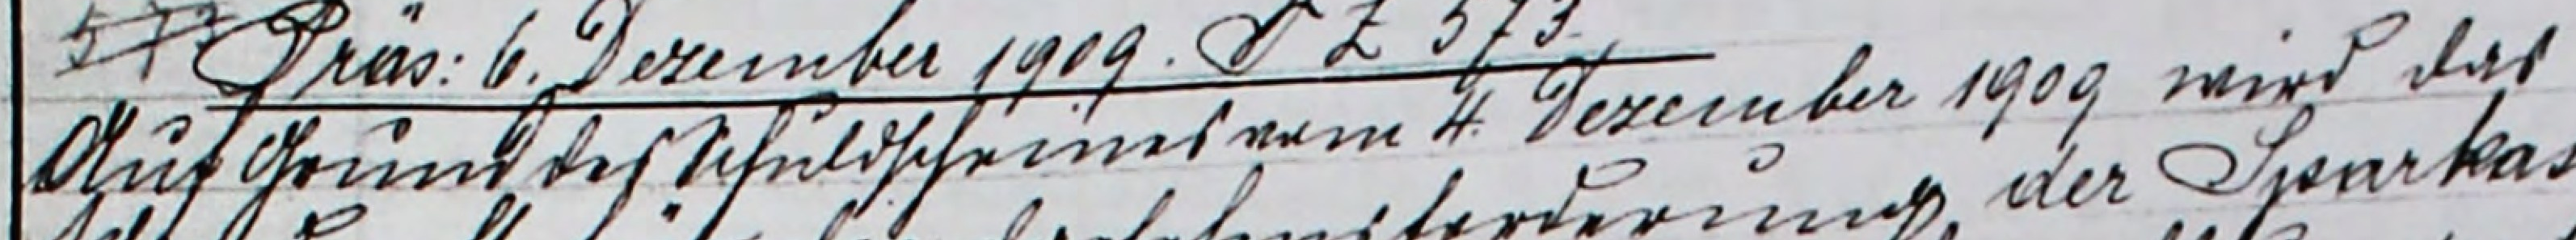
Auf Grund des Schuldscheines vom 4. Dezember 1909 wird das
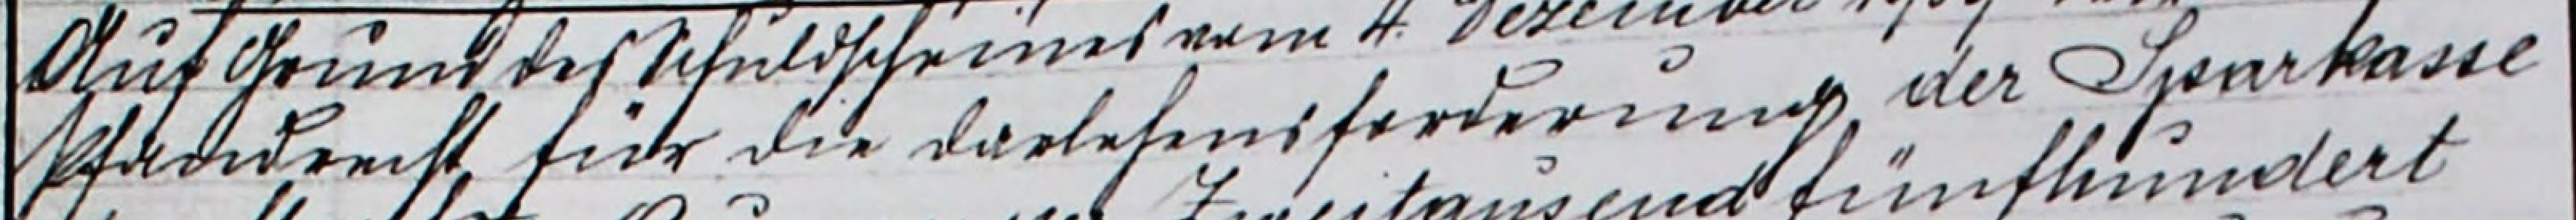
Pfandrecht für die Darleihensforderung der Sparkasse
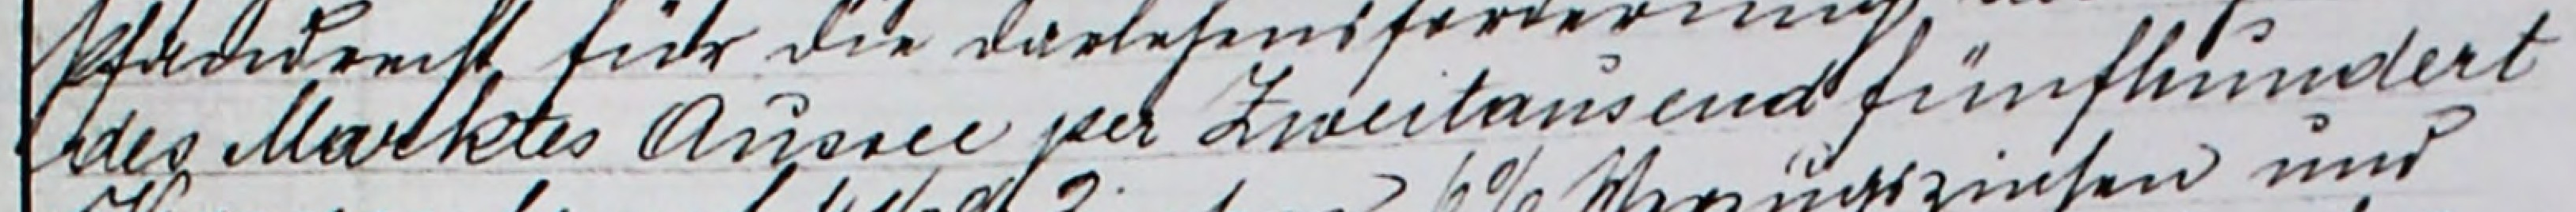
des Marktes Aussee per Zweitausend fünfhundert
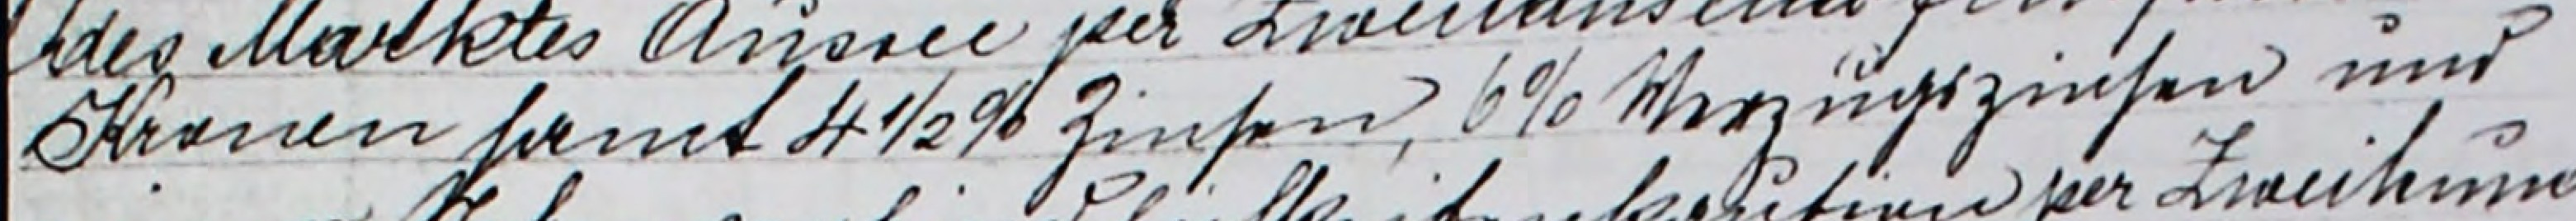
Kronen samt 4 1/2 % Zinsen, 6 % Verzugszinsen und
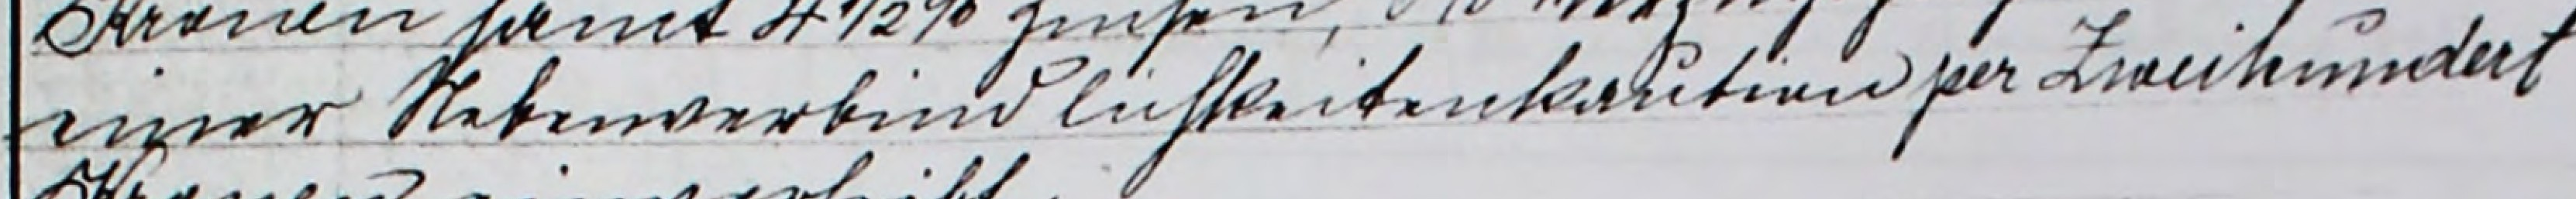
einer Nebenverbindlichkeitenkaution per Zweihundert
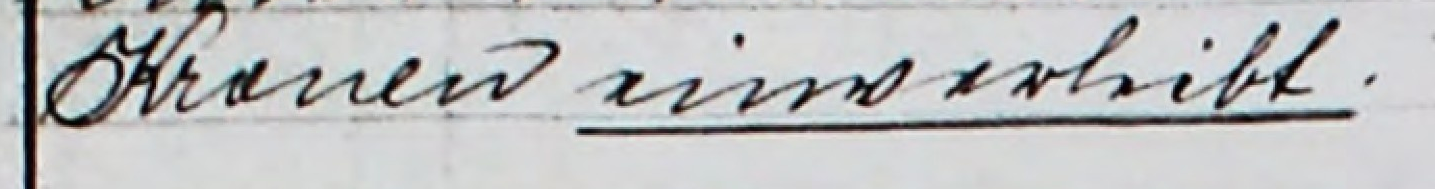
Kronen einverleibt.
